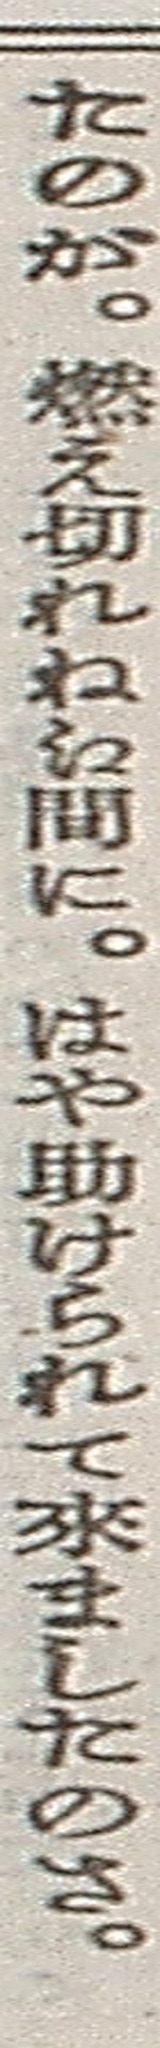たのが。燃え切れねえ間に。はや助けられて来ましたのさ。
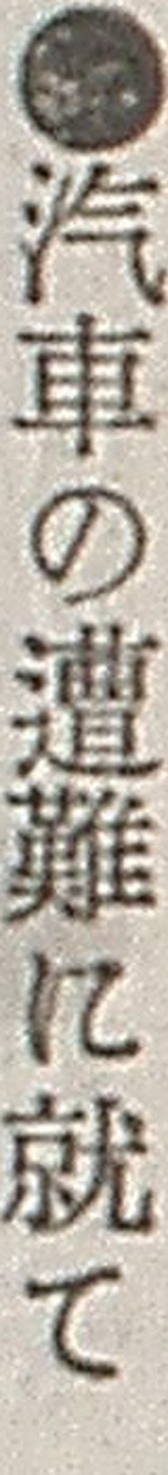●汽車の遭難に就て
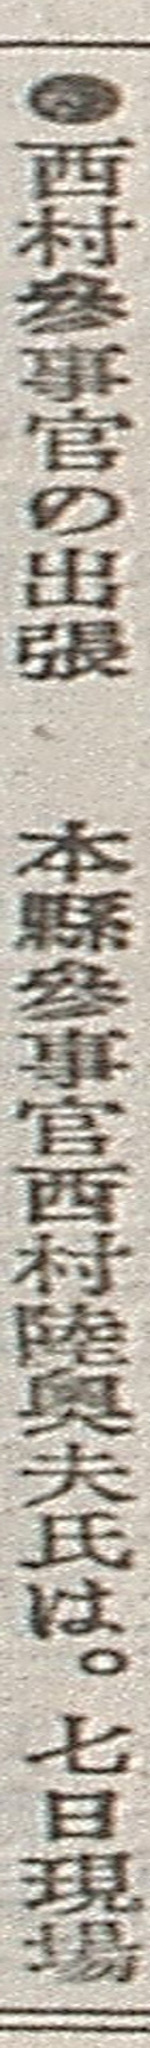●西村参事官の出張本県参事官西村陸奥夫氏は。七日現場
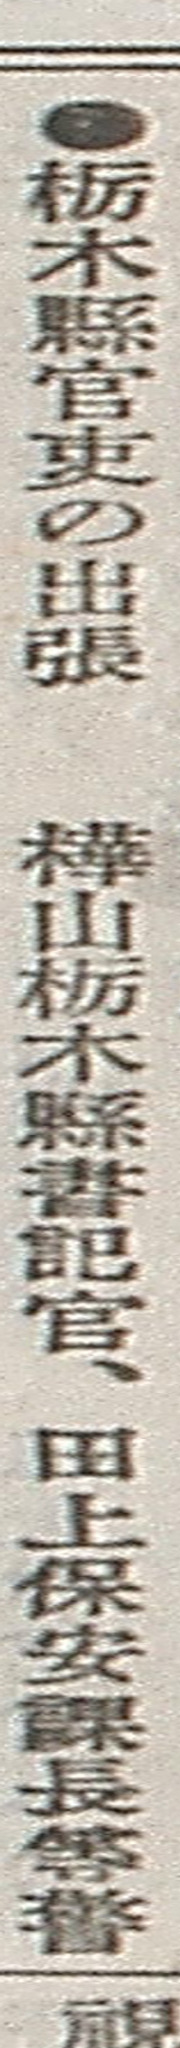●栃木県官吏の出張樺山栃木県書記官、田上保安課長等警
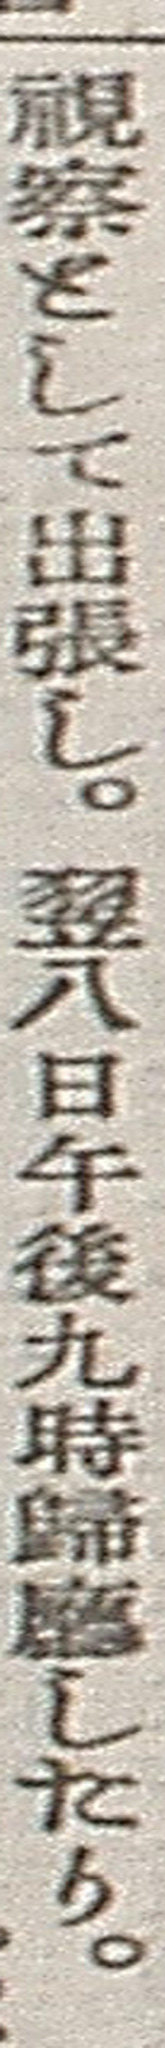視察として出張し。翌八日午後九時帰庁したり。
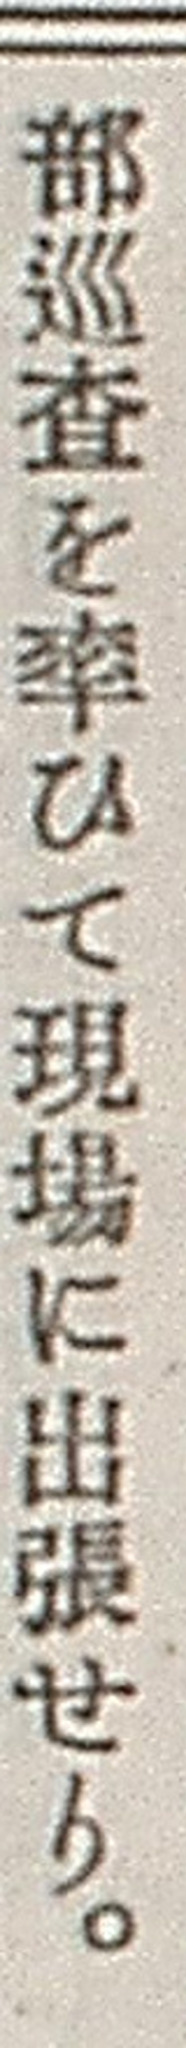部巡査を率ひて現場に出張せり。
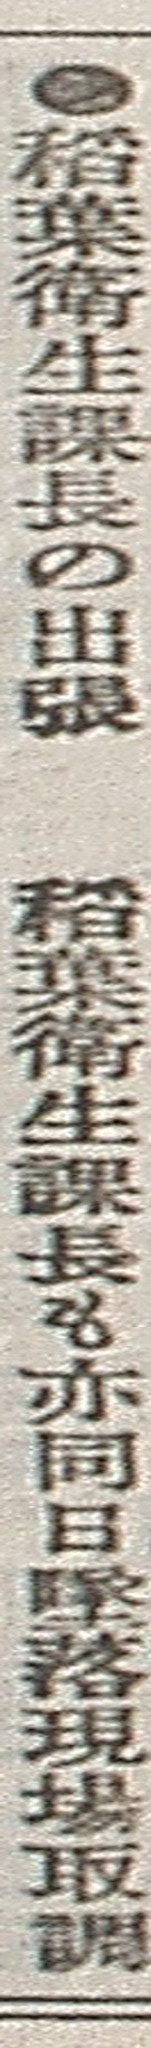●稲葉衛生課長の出張稲葉衛生課長も亦同日墜落現場取調
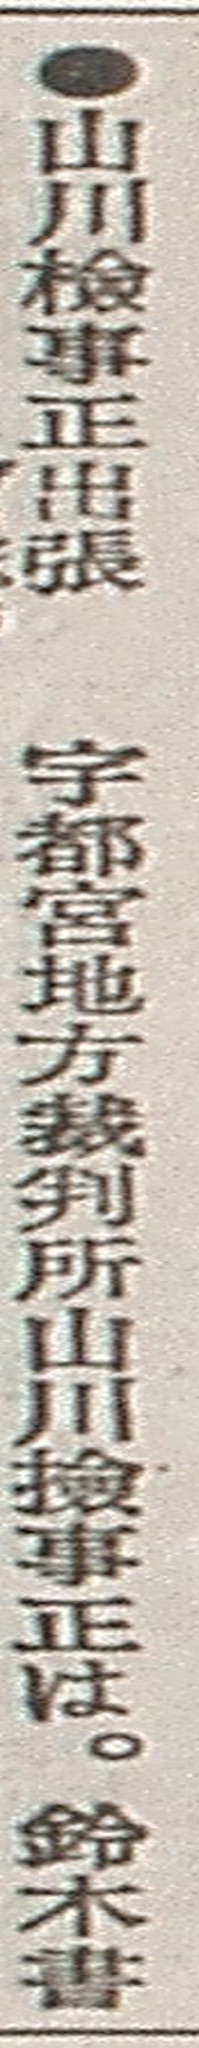●山川検事正出張宇都宮地方裁判所山川検事正は。鈴木書
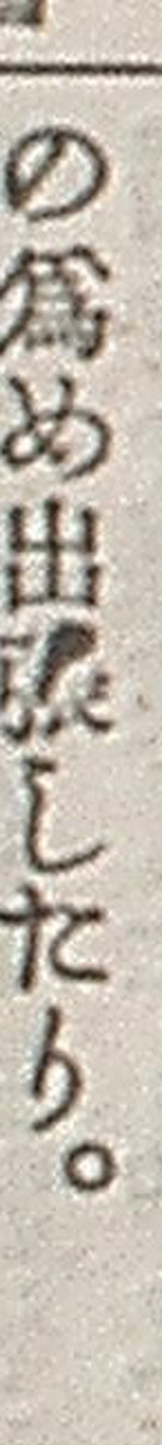の為め出張したり。
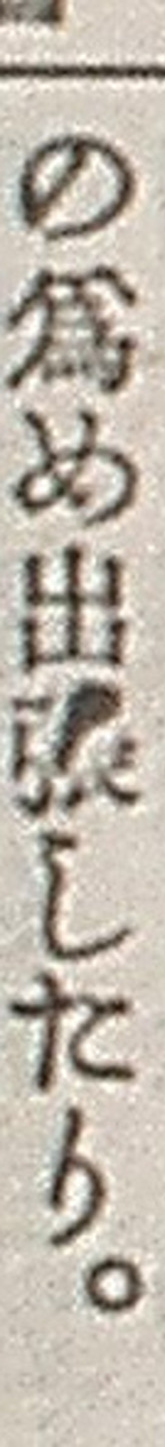の為め出張したり。
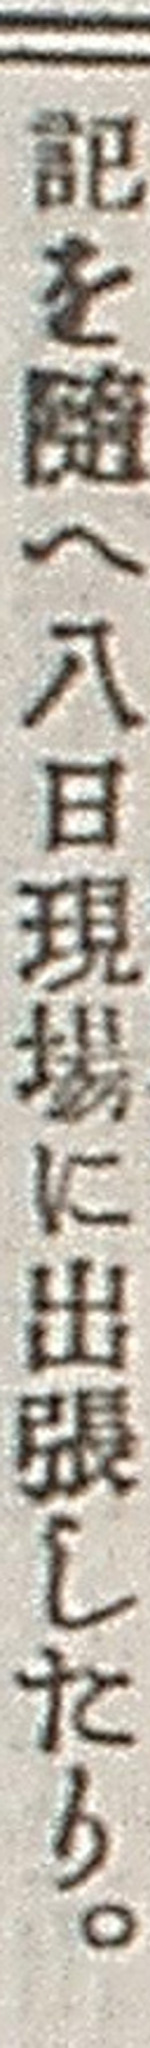記を随へ八日現場に出張したり。
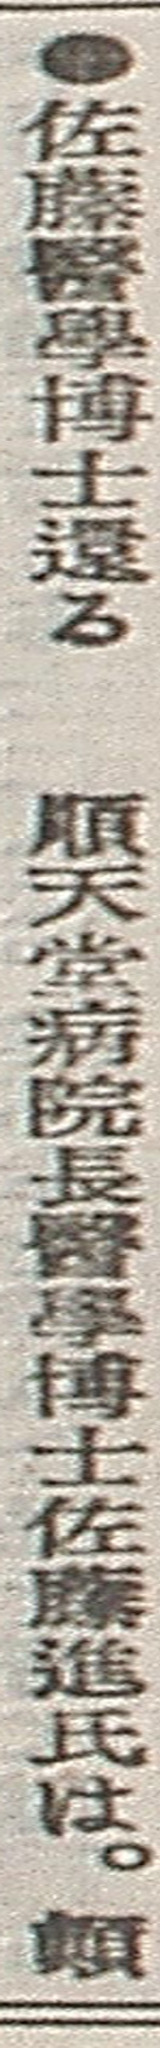●佐藤医学博士還る順天堂病院長医学博士佐藤進氏は。顚

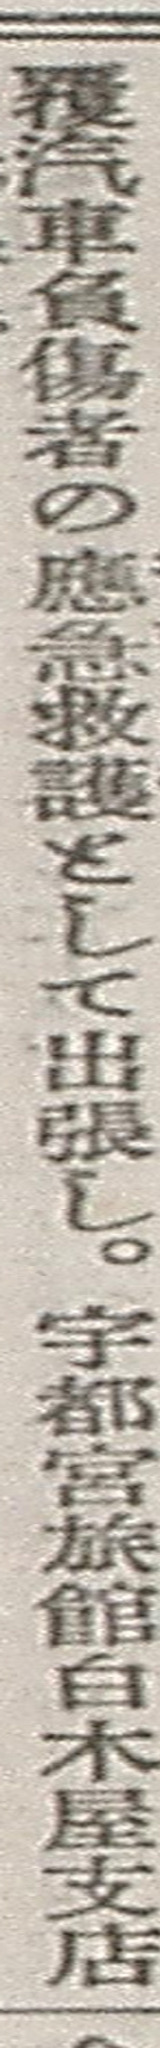覆汽車負傷者の応急救護として出張し。宇都宮旅館白木屋支店
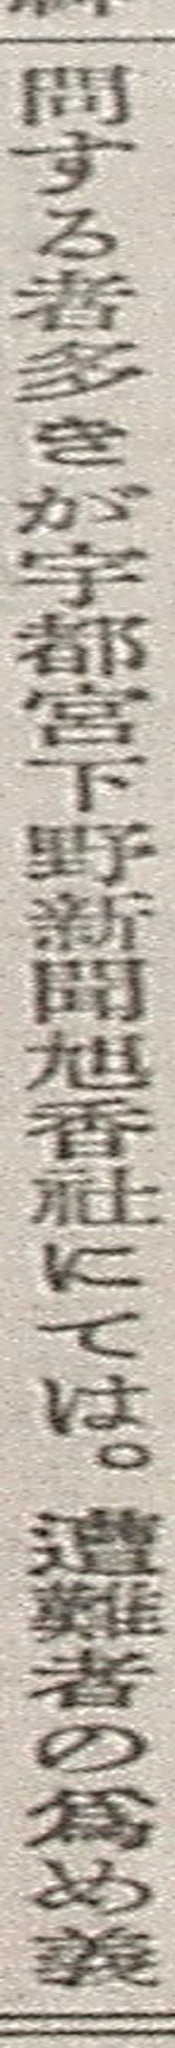問する者多きが宇都宮下野新聞旭香社にては。遭難者の為め義
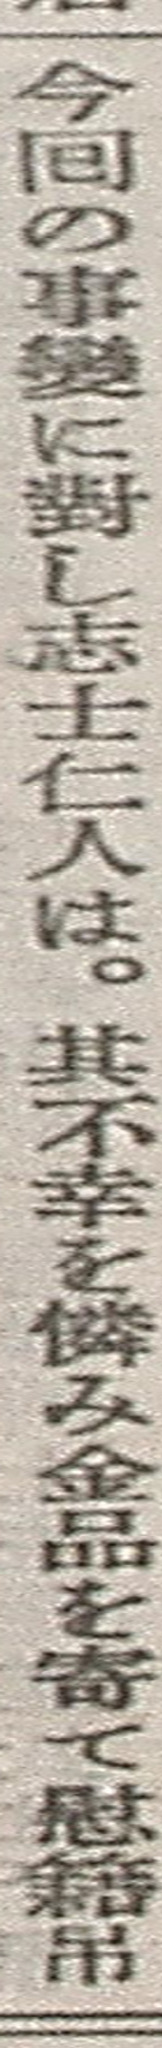今回の事変に対し志士仁人は。其不幸を憐み金品を寄て慰藉吊
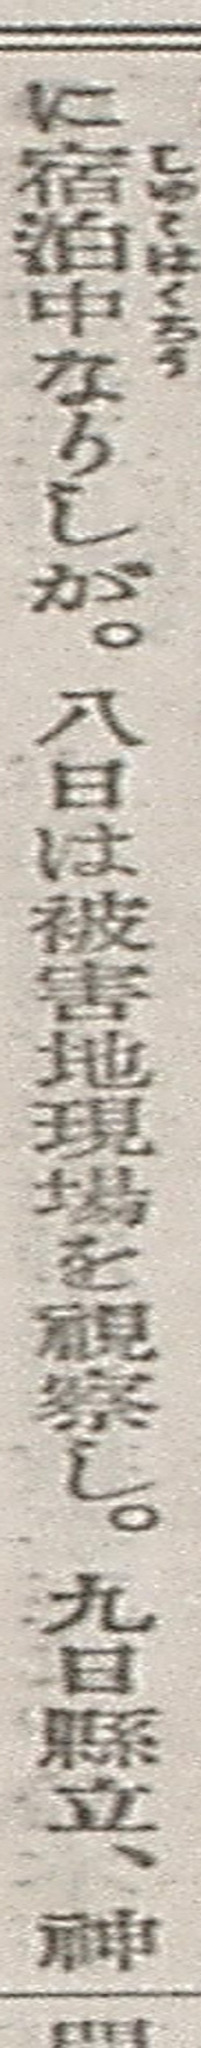に宿泊中なりしが。八日は被害地現場を視察し。九日県立、神
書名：風俗畫報臨時増刊第百九十九號　明治三十二年十月各地災害圖會（前編之續）
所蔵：東京大学地震研究所図書室 Earthquake Research Institute Library, The University of Tokyo, JAPAN
